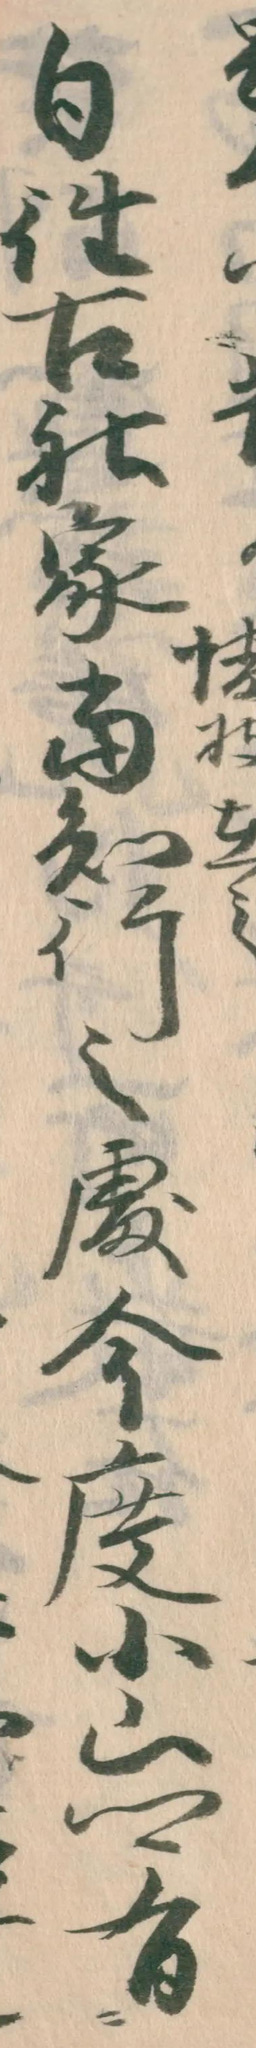自往古社家当知行之処今度小山郷有
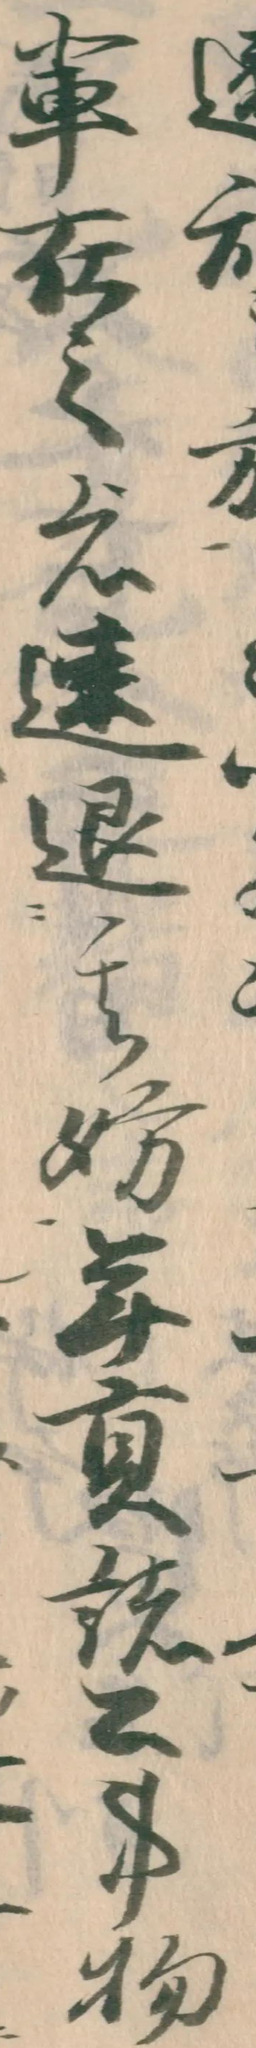輩在之者速退其妨年貢諸公事物
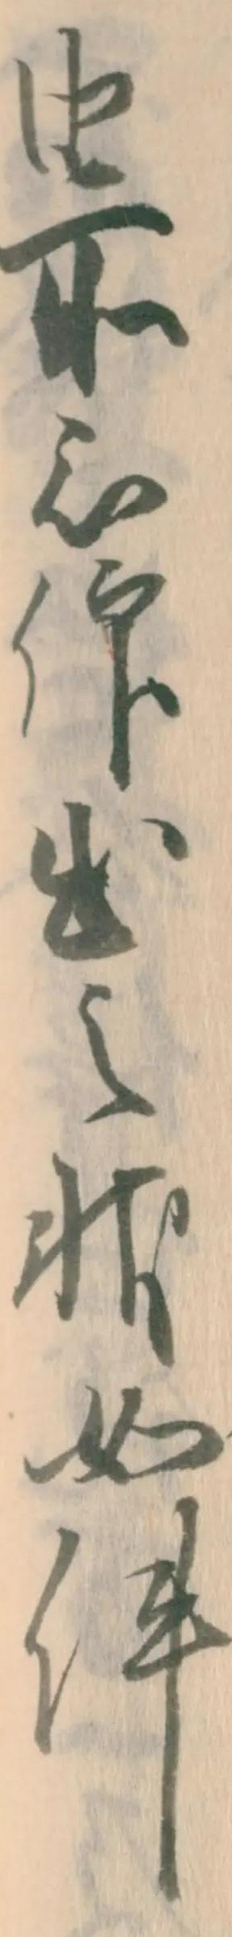由所被仰出之状如件
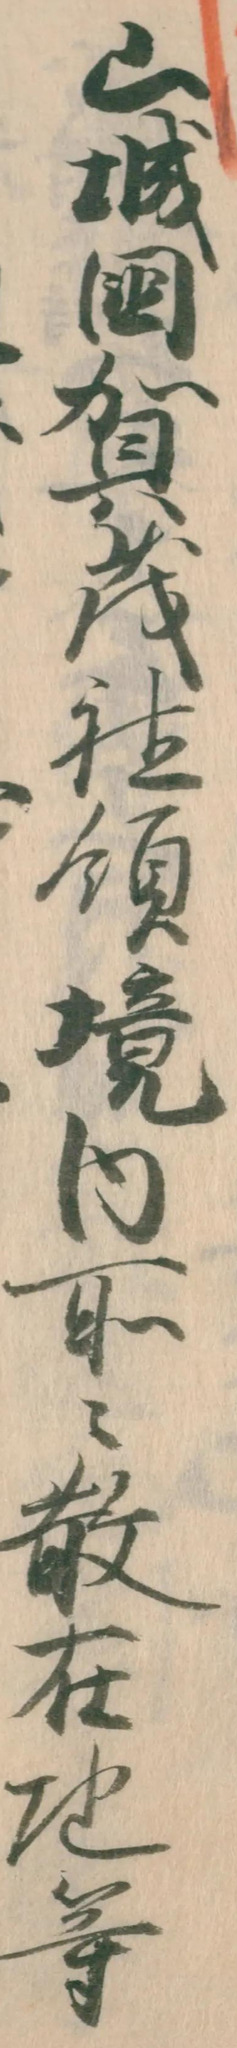山城国賀茂社領境内所々散在地等
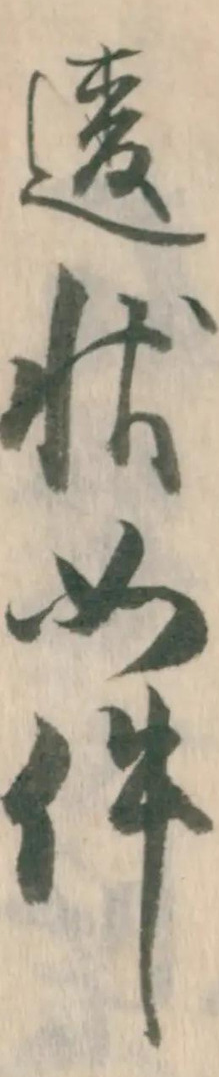違状如件
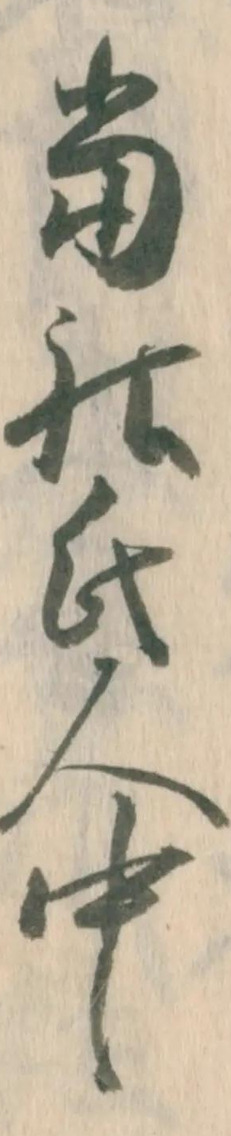当社氏人中

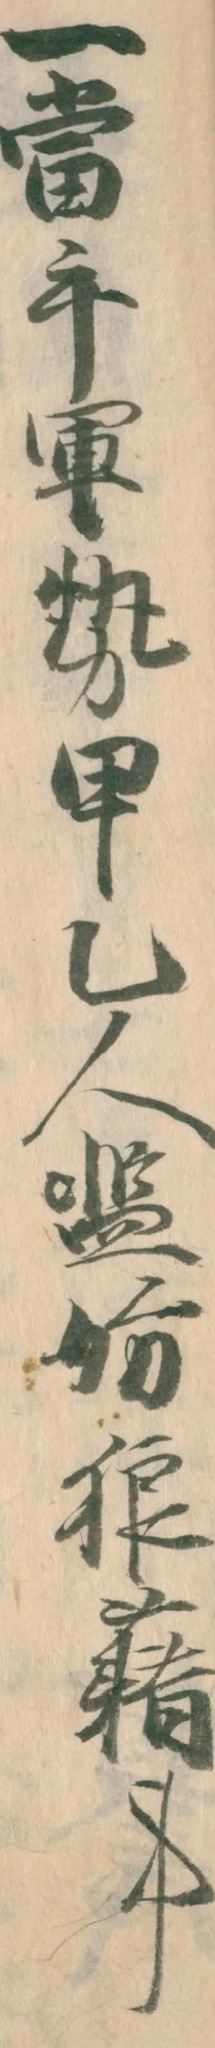一当手軍勢甲乙人濫妨狼藉事
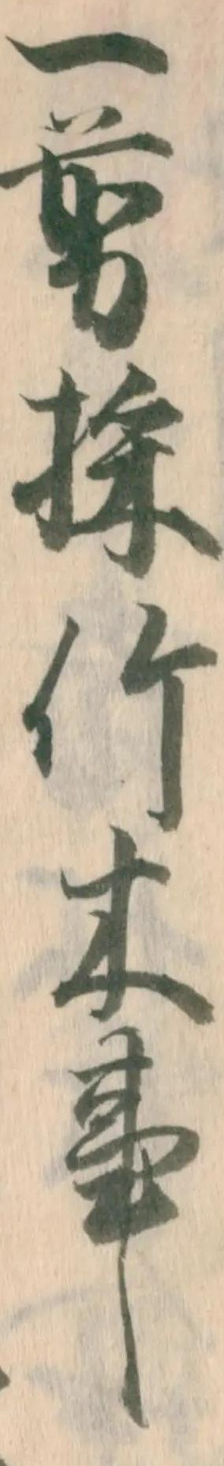一剪採竹木事
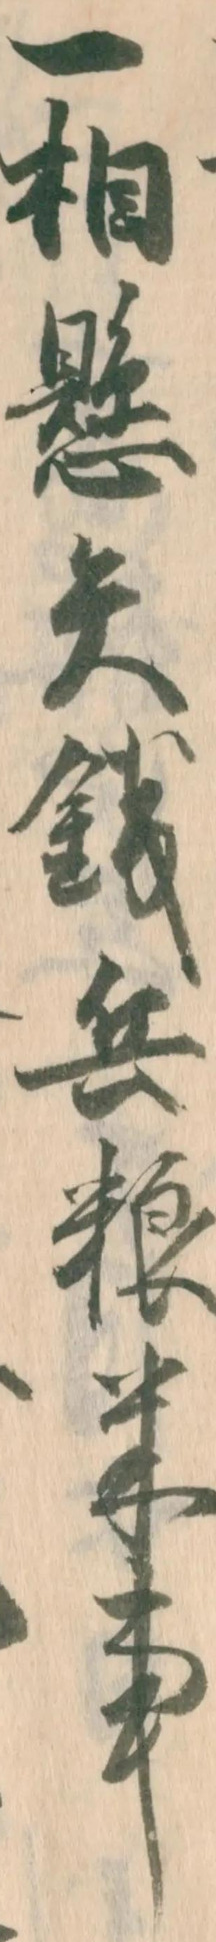一相懸矢銭兵粮米事
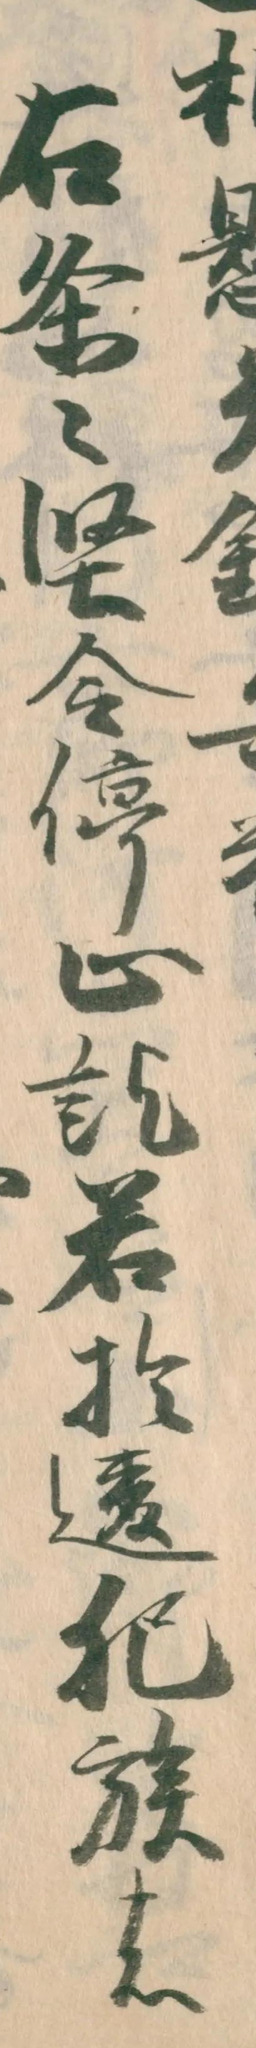右条々堅令停止訖若於違犯族者
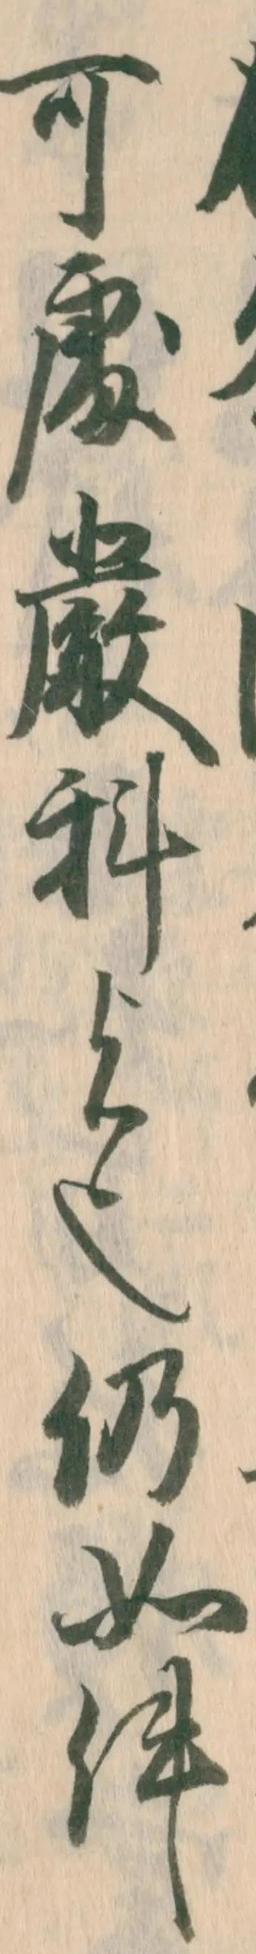可処厳科者也仍如件
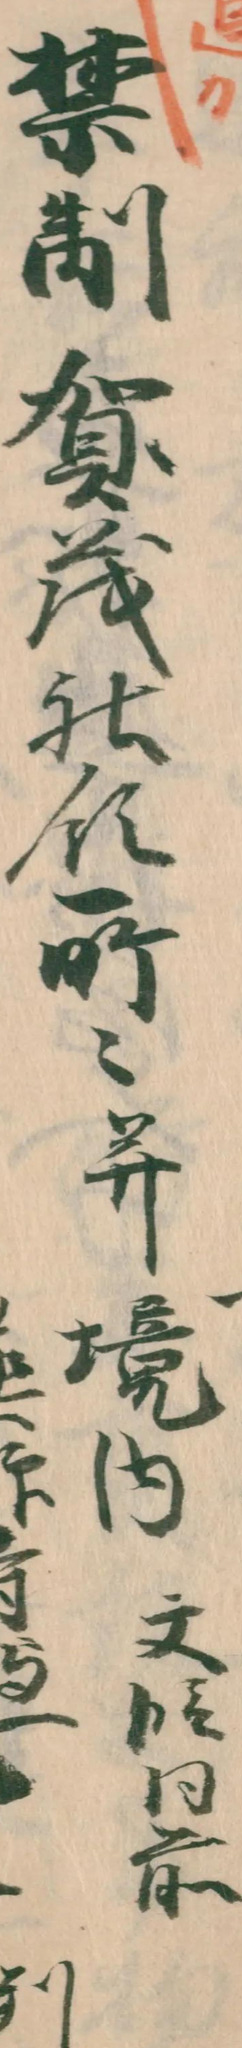禁制賀茂社領所々并境内文段同前
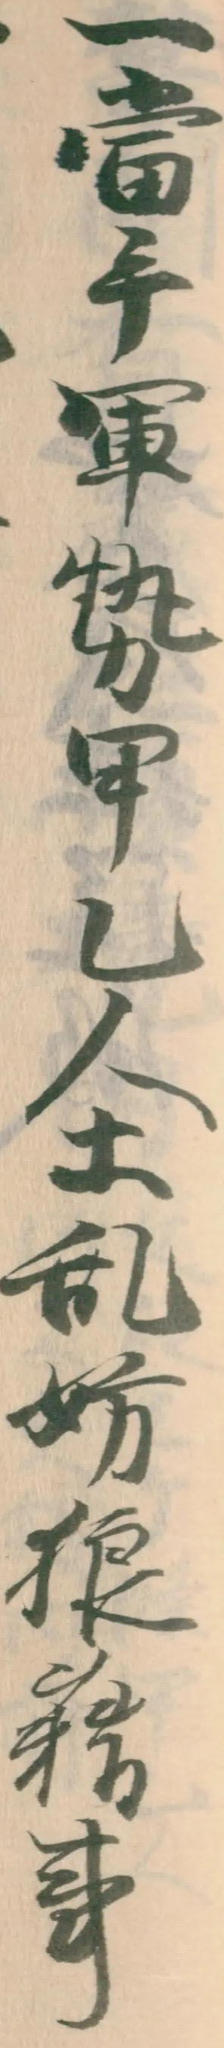一当手軍勢甲乙人等乱妨狼藉事
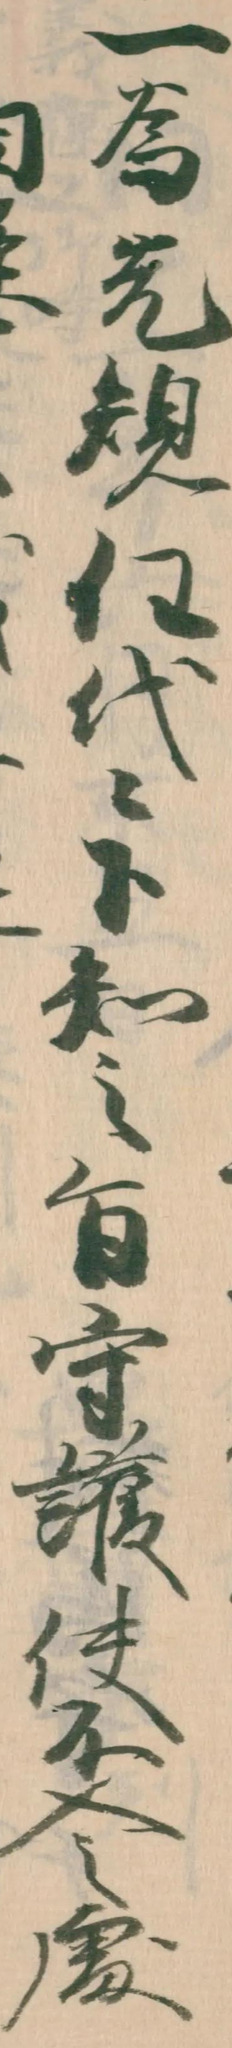一為先規任代々下知之旨守護使不入之処
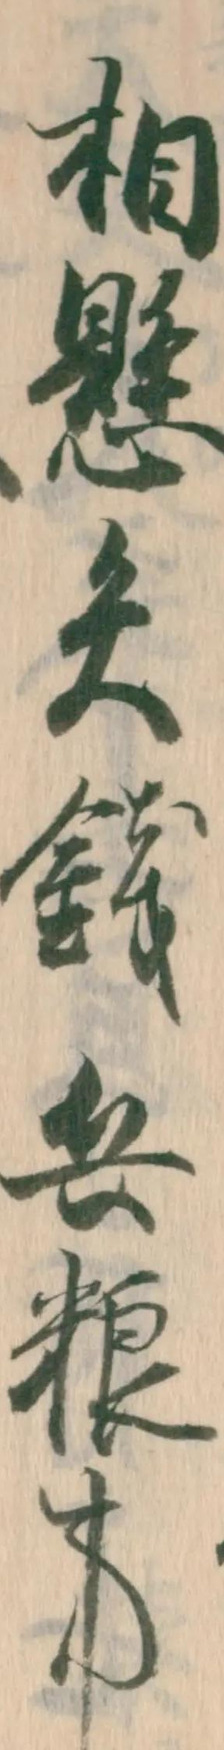相懸矢銭兵粮事
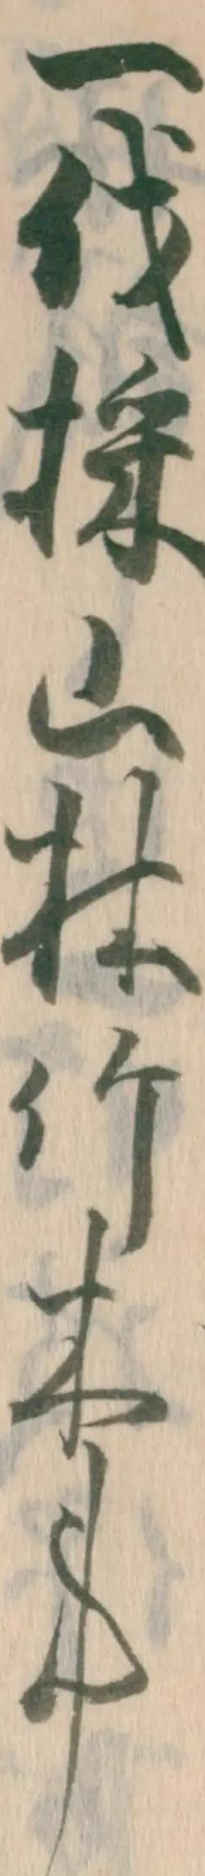一伐採山林竹木事
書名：賀茂社記録. 第1冊
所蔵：国立国会図書館 National Diet Library, JAPAN
